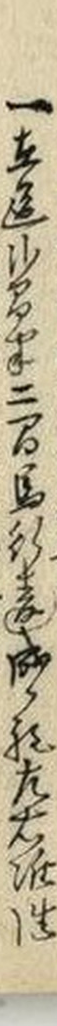一在道弐間半二間馬行違成候程左右准往
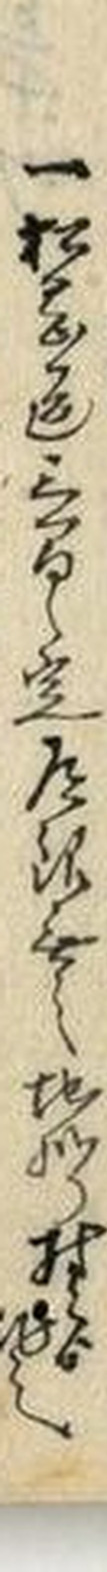一松岡道三間之定道銀無之地掛り村々ゟ作之
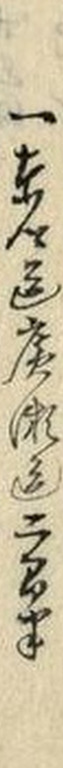一東郷道広瀬道二間半
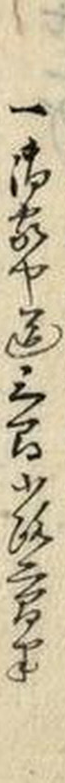一御家中道三間小路二間半

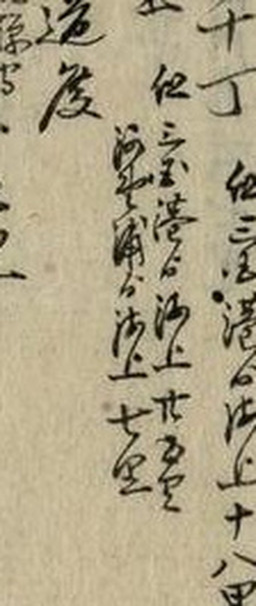河野浦ゟ海上七里
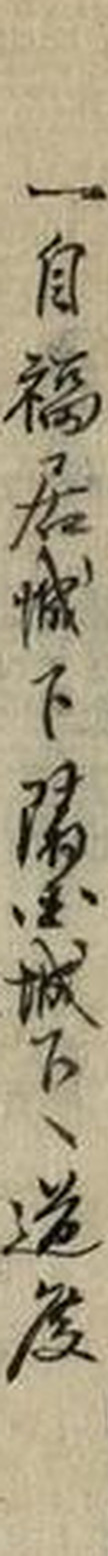一自福居城下隣国城下へ道度
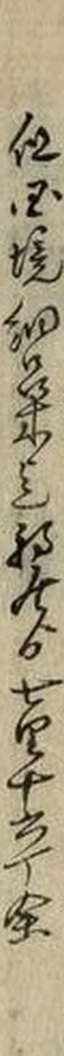但国境細呂木迄福居ゟ七里十六丁余
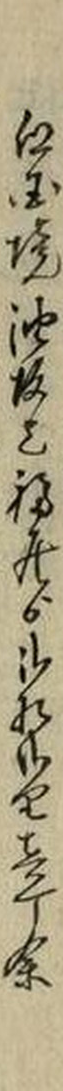但国境油坂迄福居ゟ弐拾弐里壱丁余
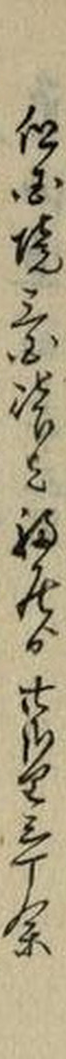但国境三国峠迄福居ゟ廿弐里三丁余
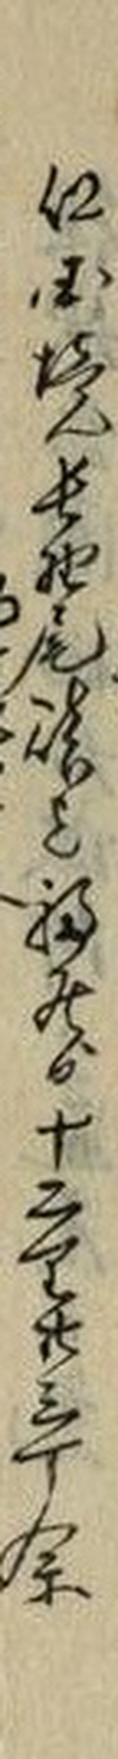但国境長野尾峠迄福居ゟ十二里廿三丁余
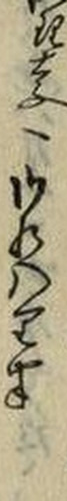居城へ弐拾八里半
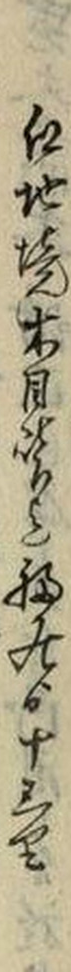但地境木目峠迄福居ゟ十五里
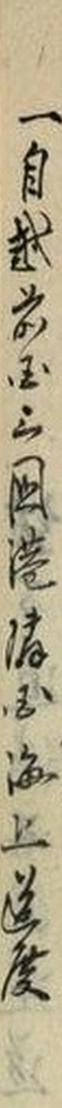一自越前国三国港隣国海上道度
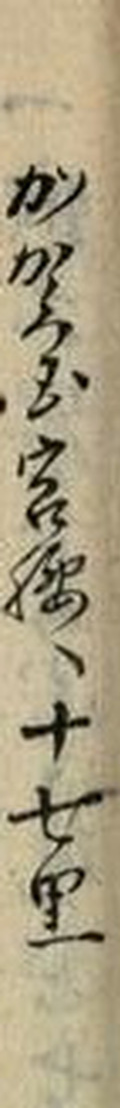加賀国宮腰へ十七里
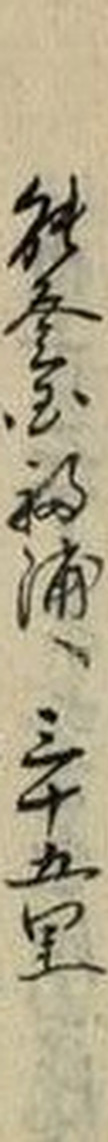能登国福浦へ三十五里
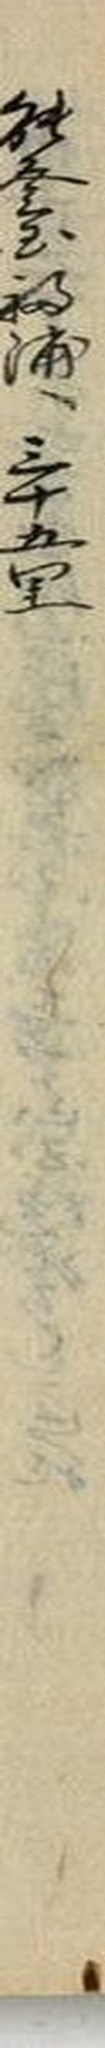能登国福浦へ三十五里
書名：御国他国諸事之部
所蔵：福井県文書館 Fukui Prefectural Archives
